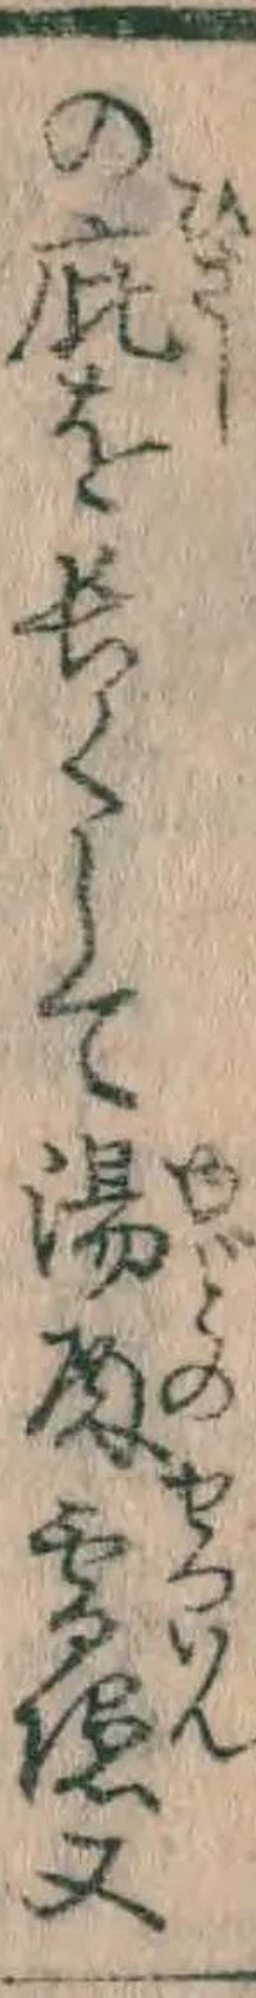の庇を長くして湯殿雪隠又
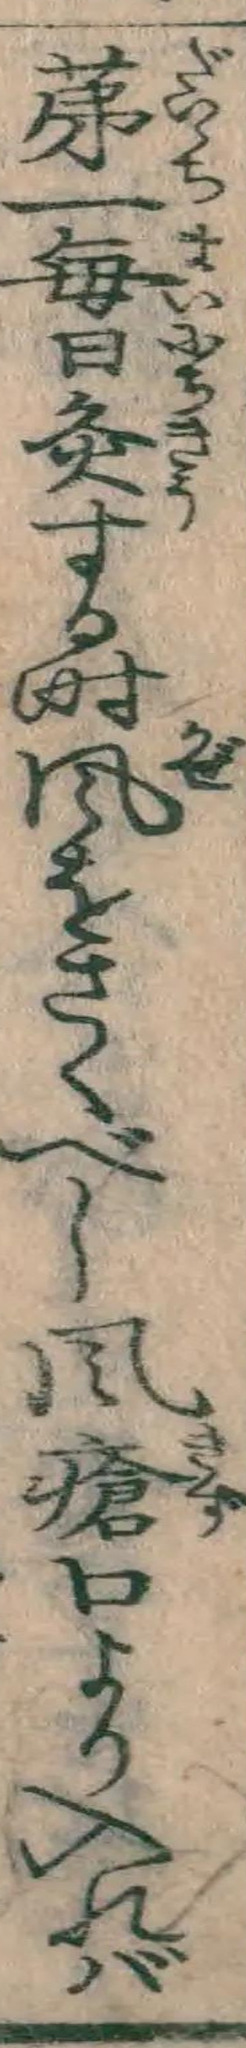第一毎日灸する時風をさくべし風瘡口より入れば
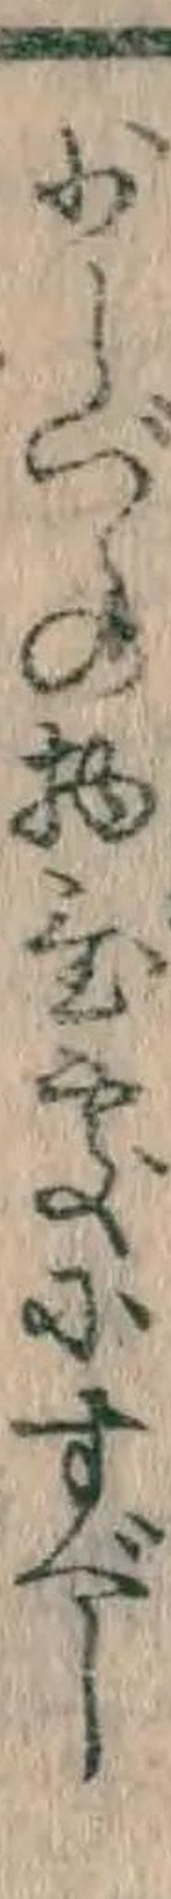少しづゝの物置處にすべし
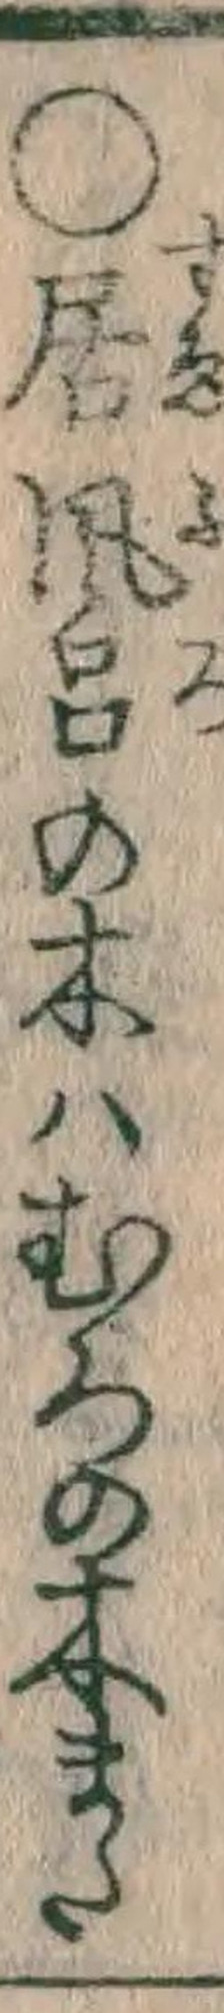○居風呂の木はむろの木また
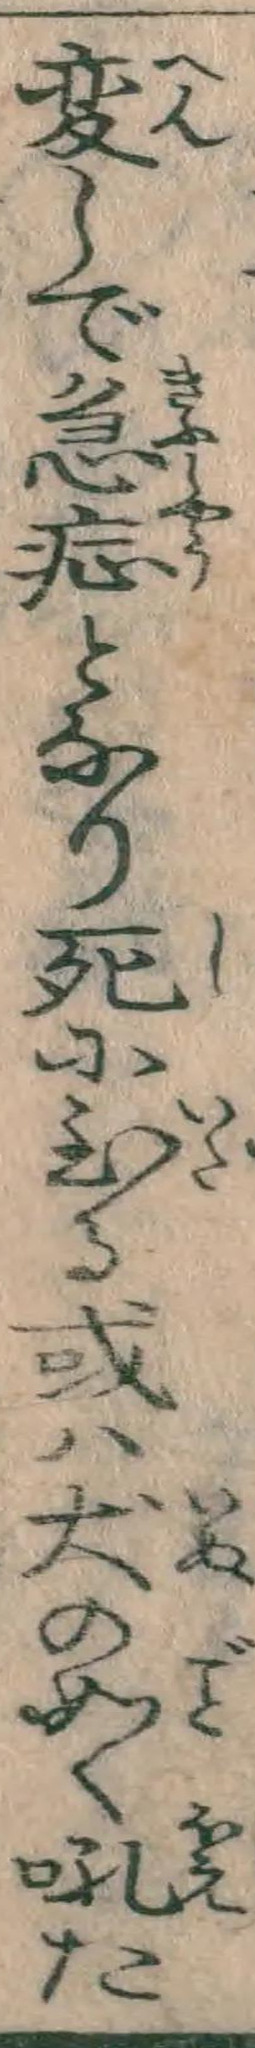変しで急症となり死に至る或は犬の如く吼た
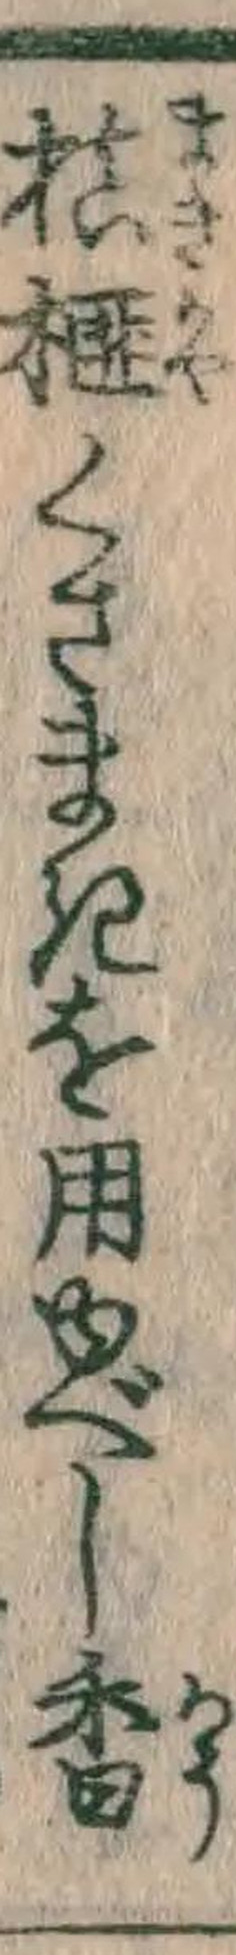槙榧くさまきを用ゆべし香
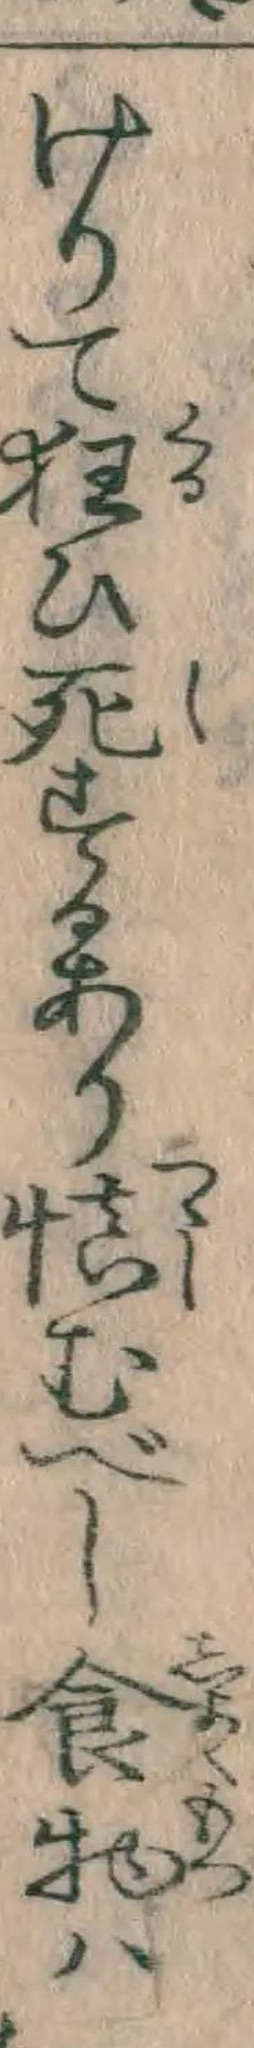けりて狂ひ死するあり慎むべし食物は
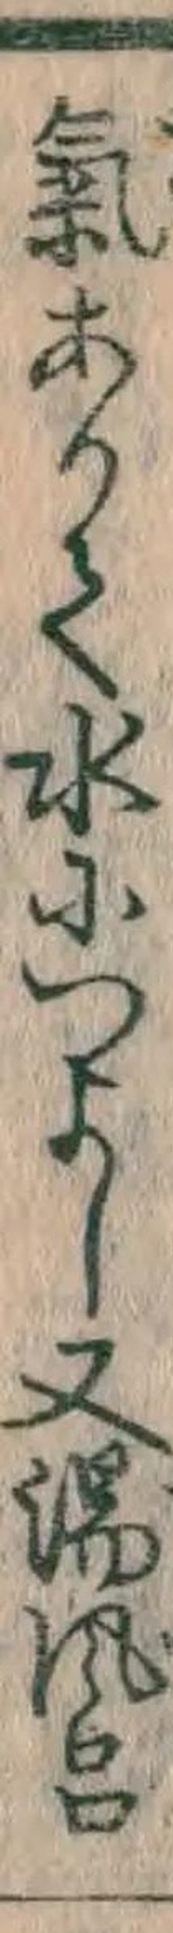気ありて水につよし又湯風呂
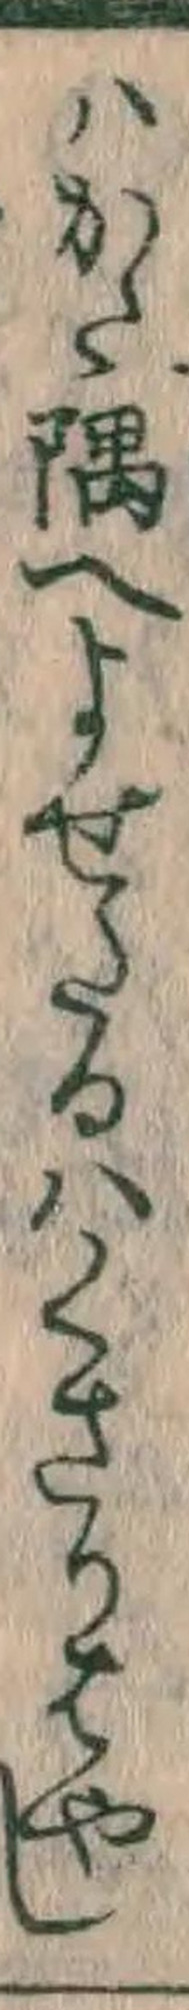はかた隅へよせたるはくさりはやし
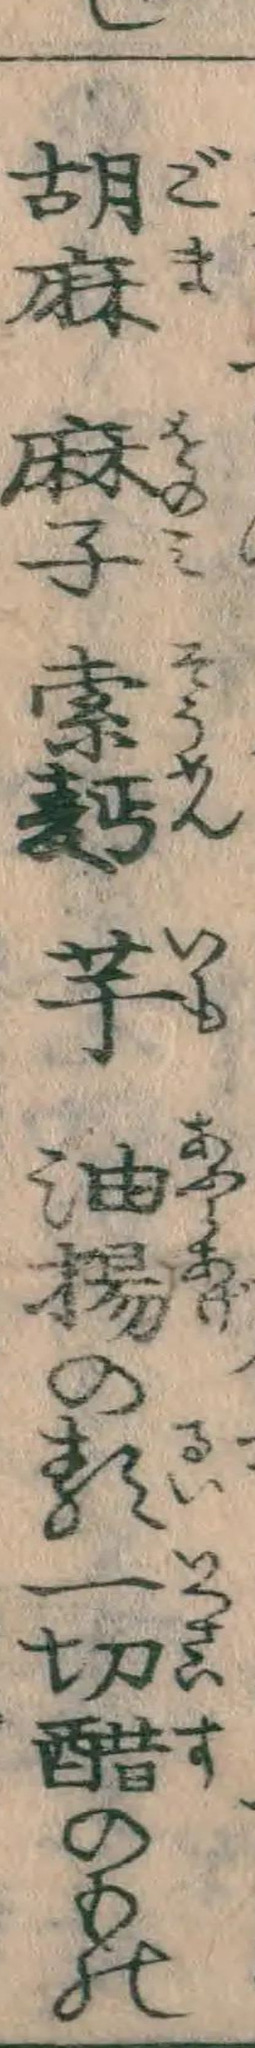胡麻麻子索麺芋油揚の類一切醋のもの
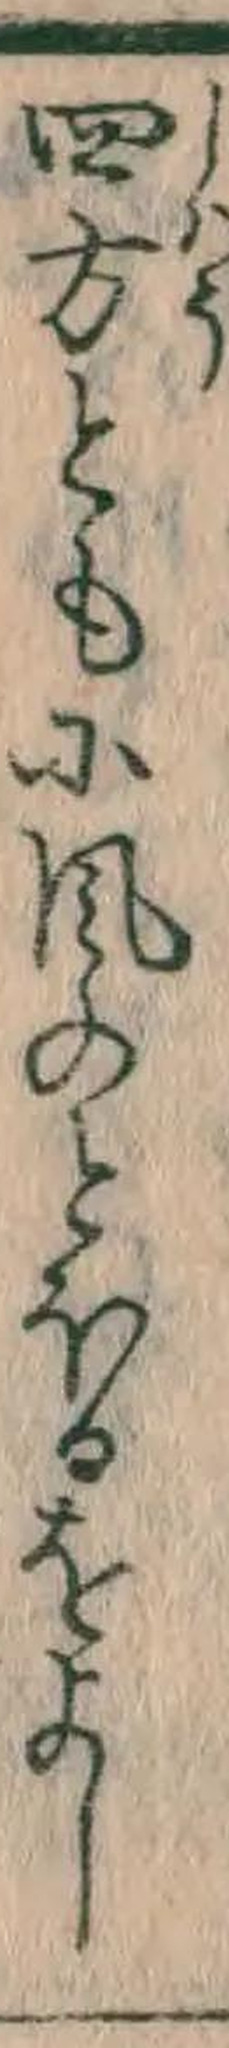四方ともに風のとほるをよし
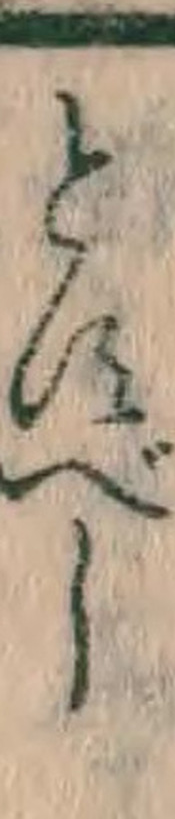とすべし
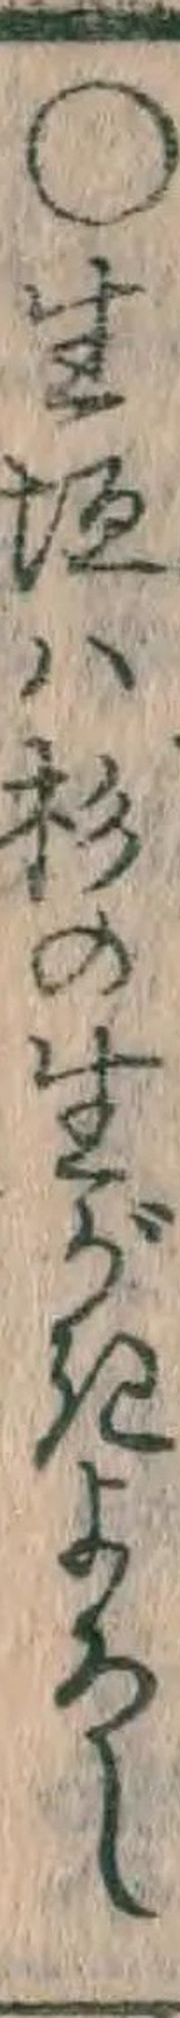○生垣は杉の生がきよろし
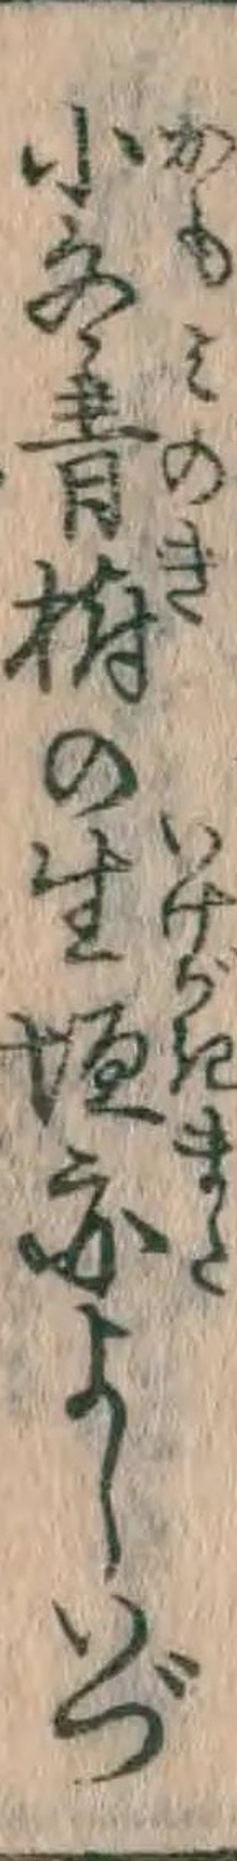小冬青樹の生垣亦よしいづ
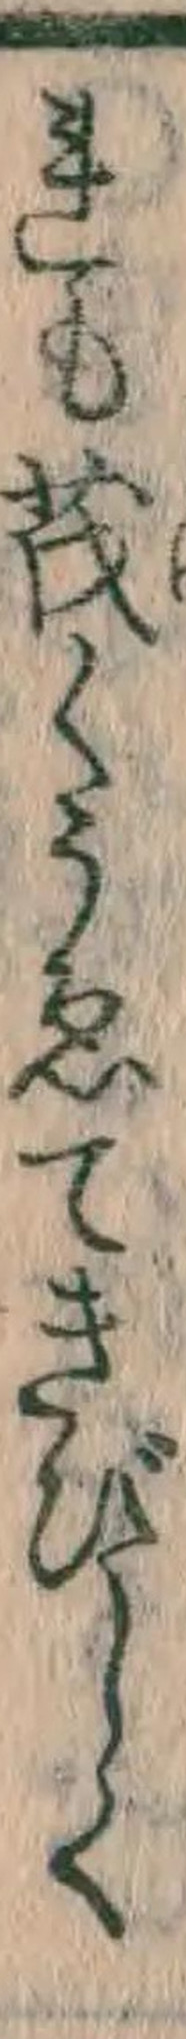れも茂くうゑてきびしく
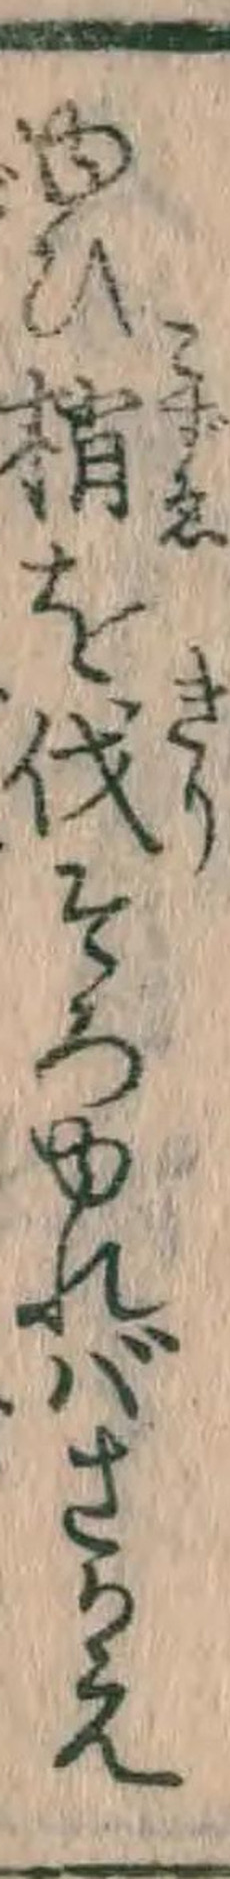ゆひ梢を伐そろゆればさかえ
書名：広益秘事大全 3巻. [3]
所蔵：国立国会図書館 National Diet Library, JAPAN
